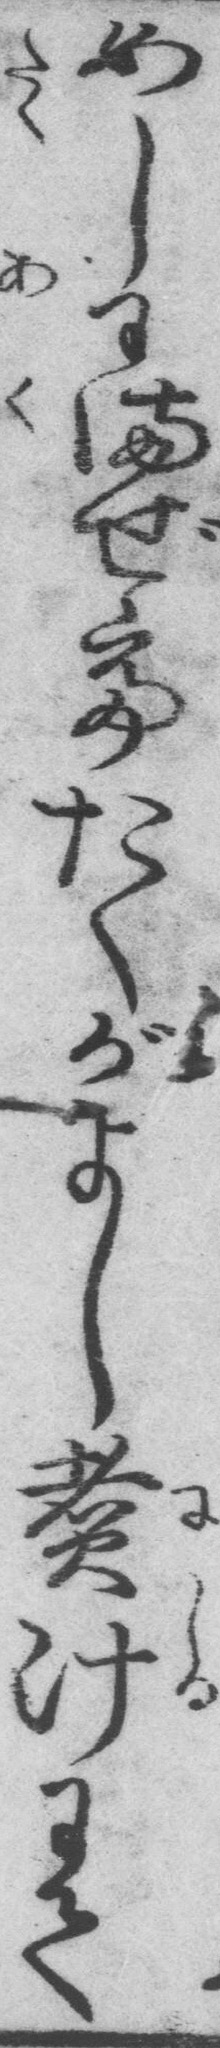めし尓満ぜ亭たくがよし煮汁尓て
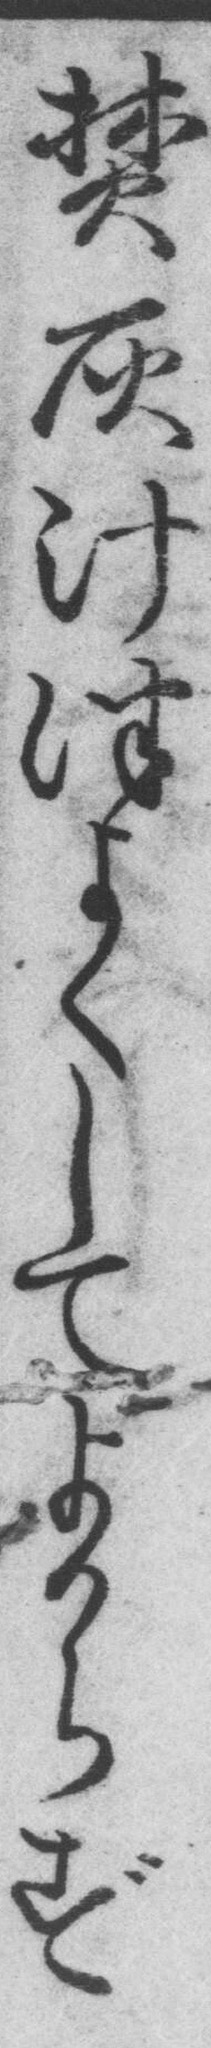焚灰汁津よくしてよからず
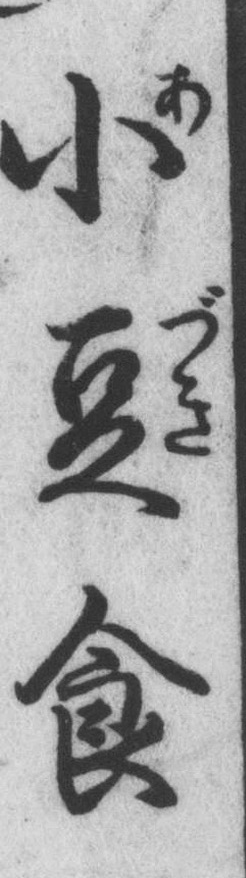小豆食
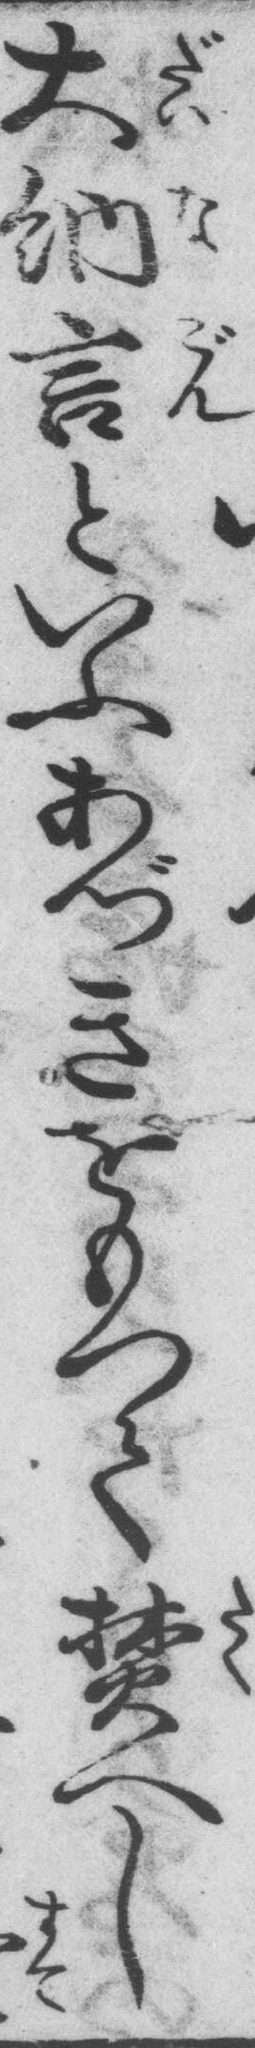大納言といふあづきをもつて焚へし
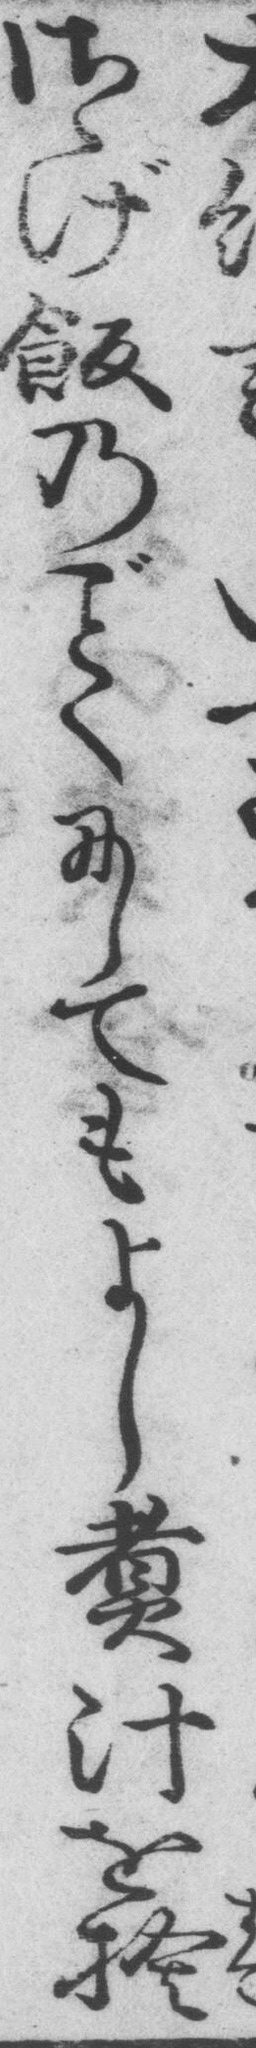佐々げ飯乃ごとく丹してもよし煮汁を捨
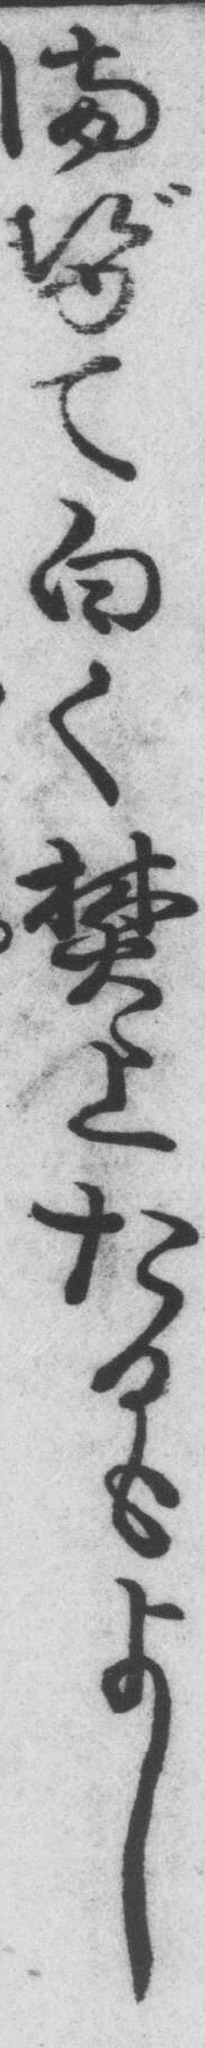満ぜて白く焚上たるもよし
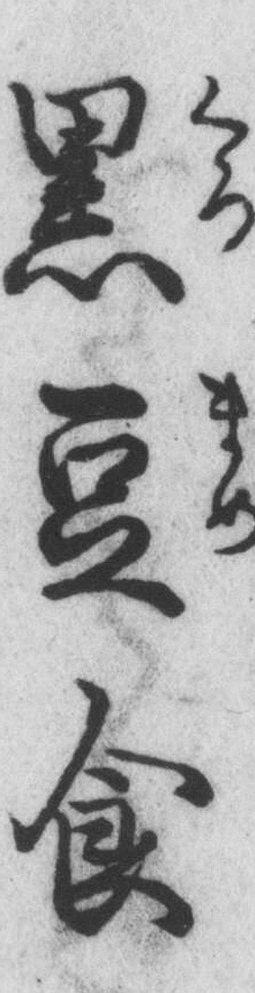黒豆食
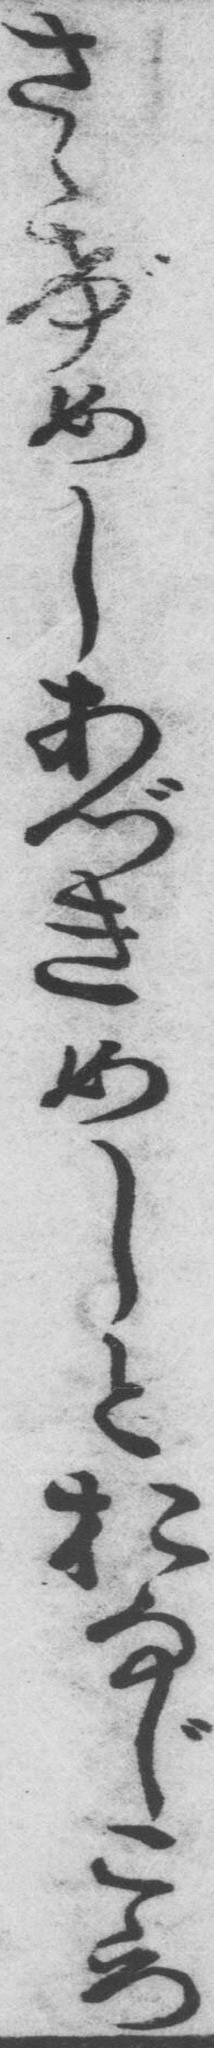さゝげめしあづきめしと於なじこゝろ
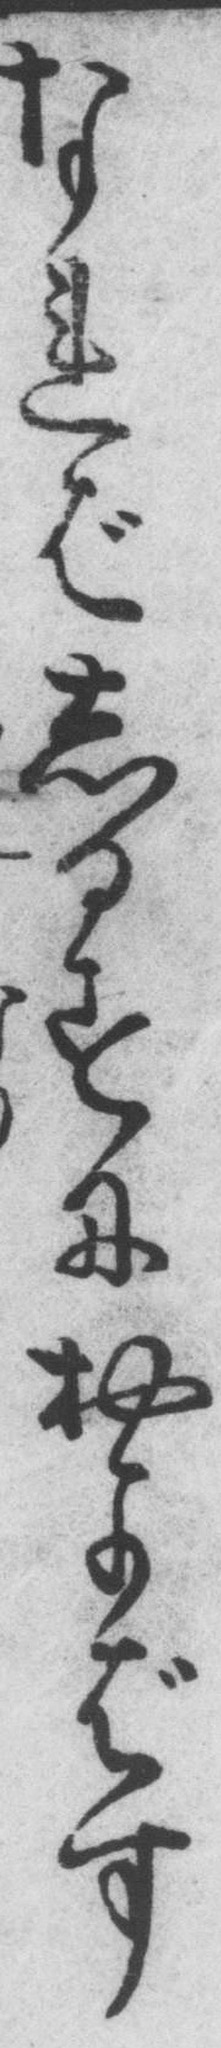な連ば志る春丹およばす
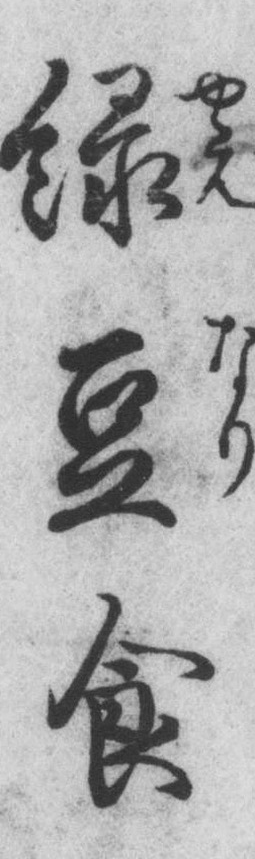緑豆食
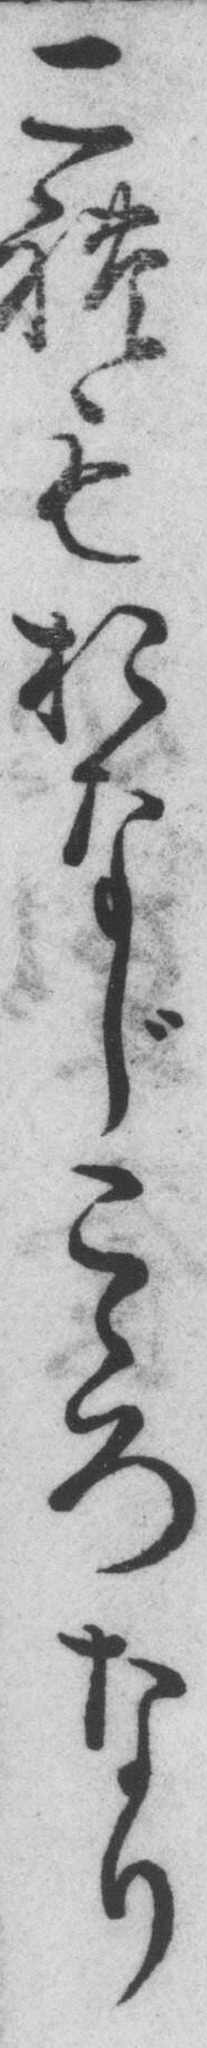こ禮も於なじこゝろなり

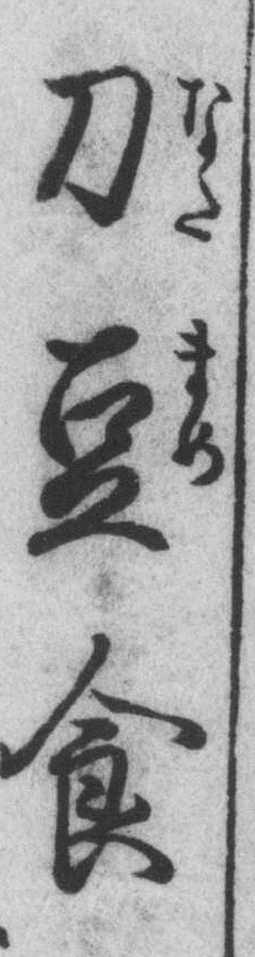刀豆食
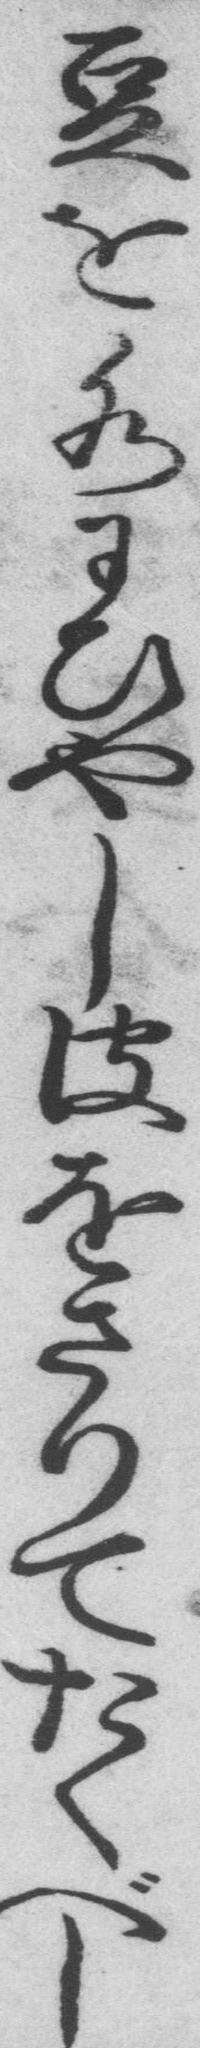豆を水尓ひやし皮をさりてたくべし
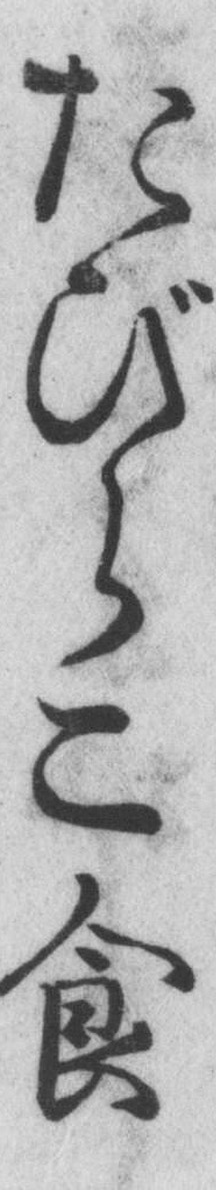たびらこ食
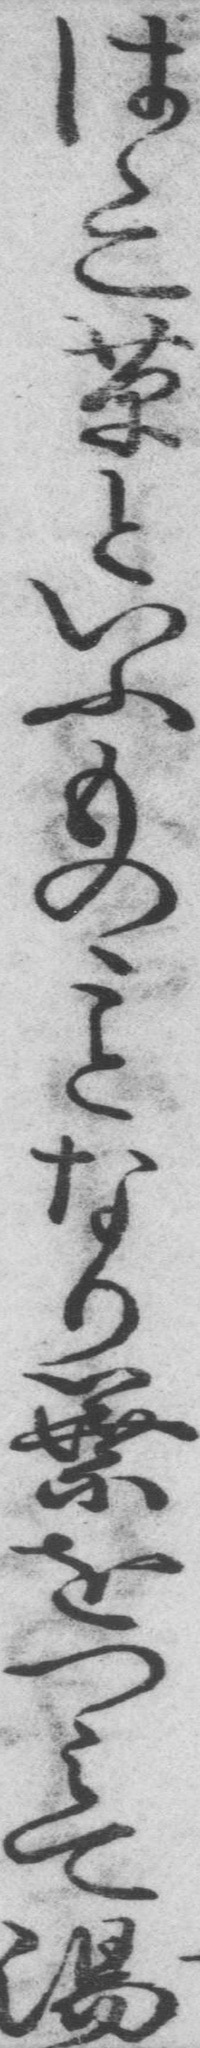はゝこ草といふものことなり葉をつみて湯
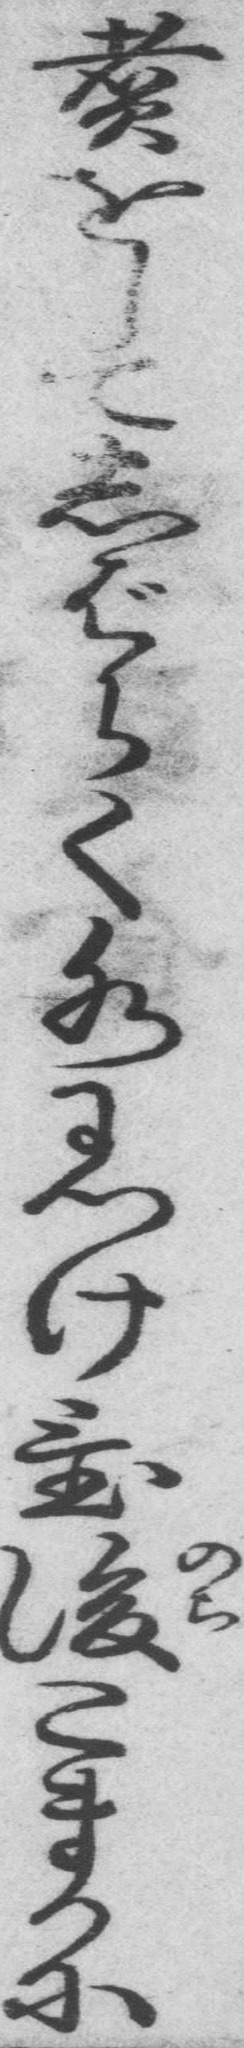煮をして志ばらく水尓つけ置後こまか尓
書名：料理伊呂波庖丁
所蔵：大阪府立大学学術情報センター 国文学研究資料館
